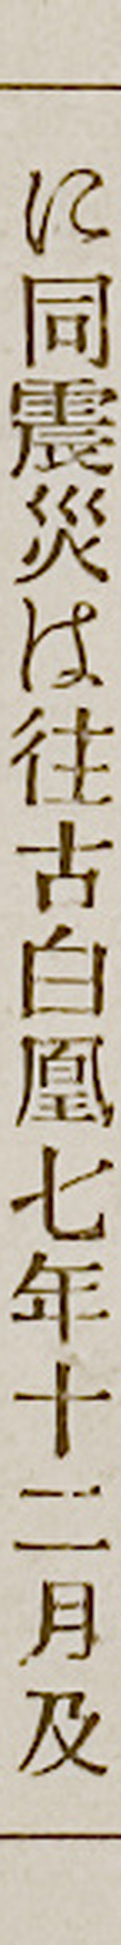に同震災は往古白凰七年十二月及
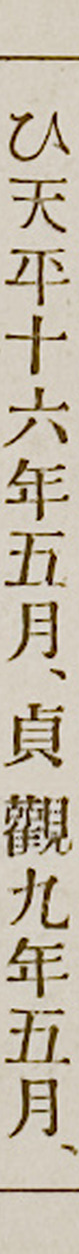ひ天平十六年五月、貞観九年五月、
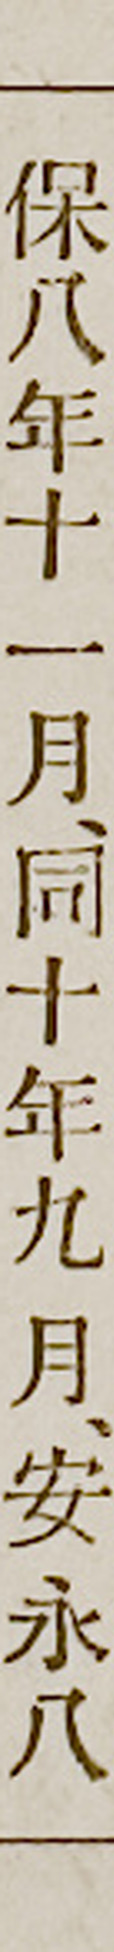保八年十一月、同十年九月、安永八
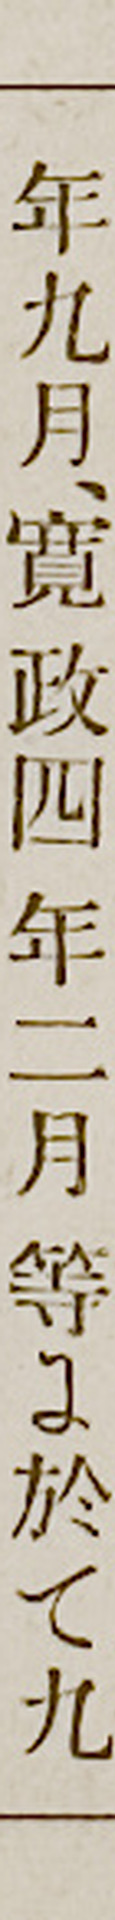年九月、寛政四年二月等に於て九
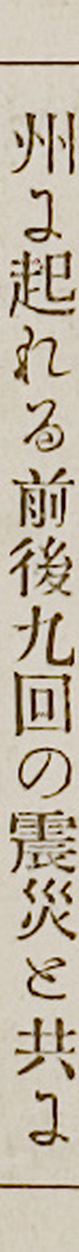州に起れる前後九回の震災と共に
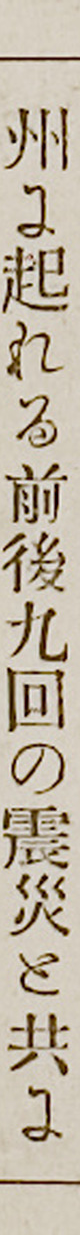州に起れる前後九回の震災と共に
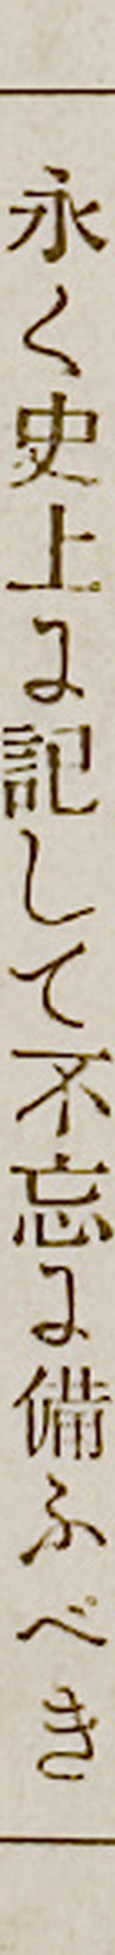永く史上に記して不忘に備ふべき
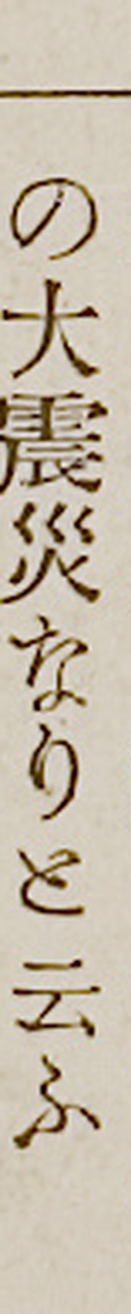の大震災なりと云ふ
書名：熊本県下飽田郡高橋町市街震災被害真図
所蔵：東京大学総合図書館 General Library in the University of Tokyo, JAPAN
